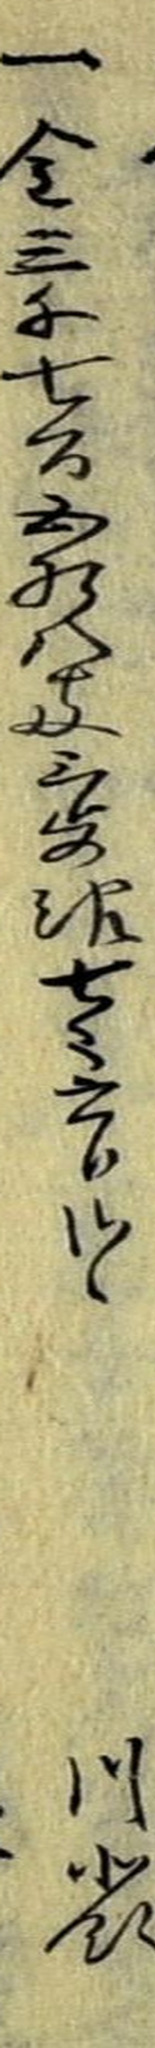一金三千七百五拾八両三歩銀七匁六分弐厘川北領
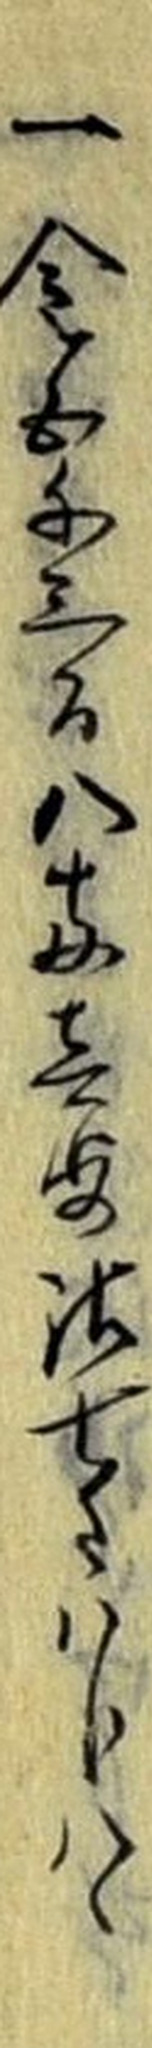一金五千三百八両壱歩銀七匁八分八厘上領
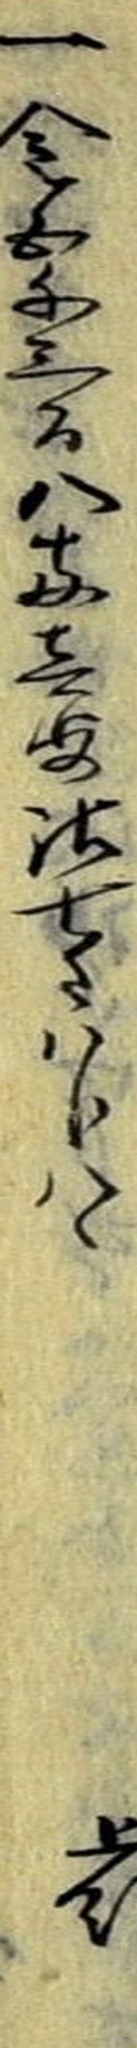一金五千三百八両壱歩銀七匁八分八厘上領
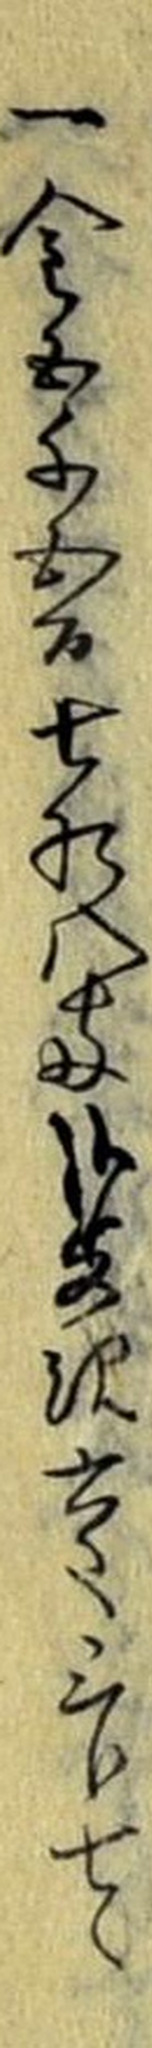一金五千五百七拾八両弐歩銀六匁三分七厘中領

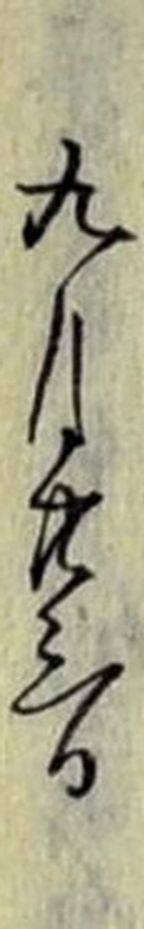九月廿三日
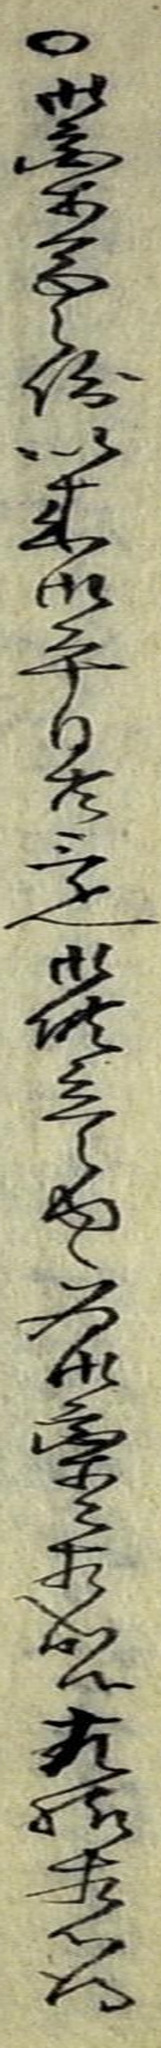○御牽馬之儀以来御平日共三疋御供立之内へ為御牽ニ相成候左様相心得
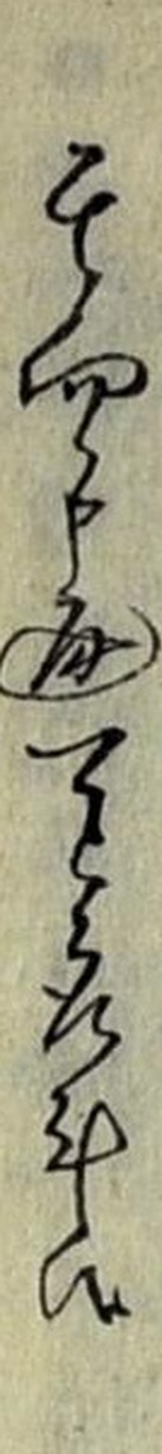其向へ申通可被取計候
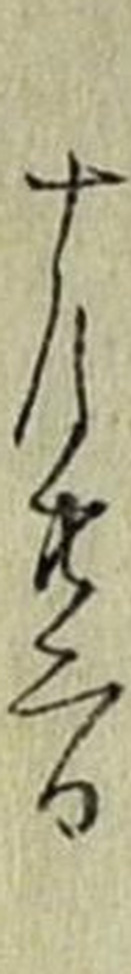十月廿二日
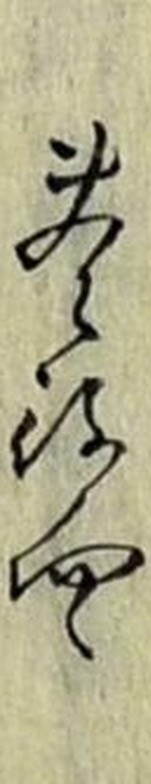夫々役向へ
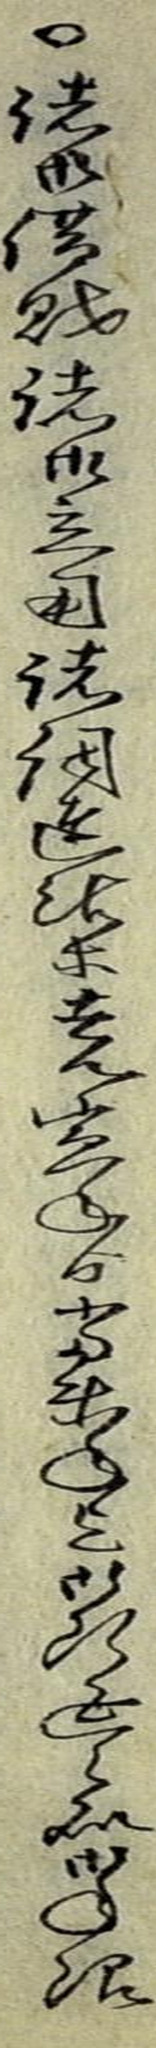○諸御借財諸御立用諸調達銀等去ル寅年ゟ当未年迄御断延之処御年限
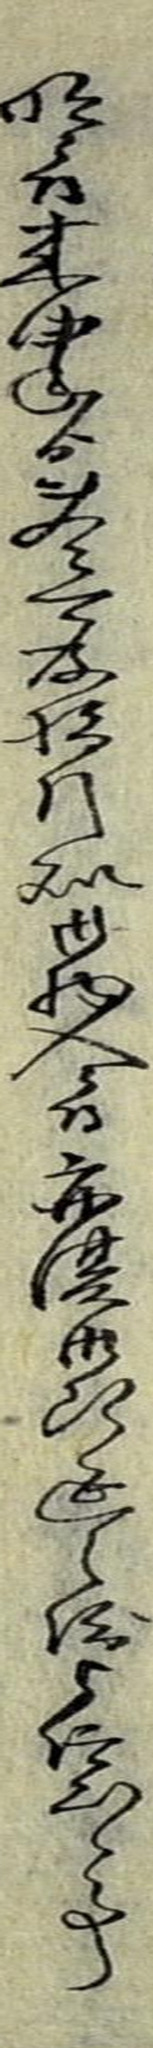明ニ付来申年ゟ夫々可及指引処御物入ニ付亦復御断延之儀被仰出候事
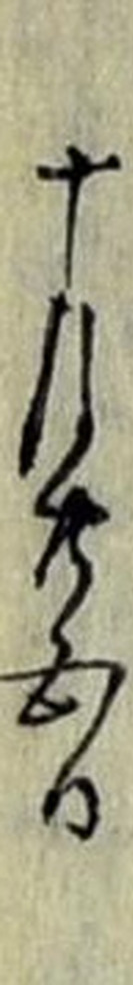十月廿五日
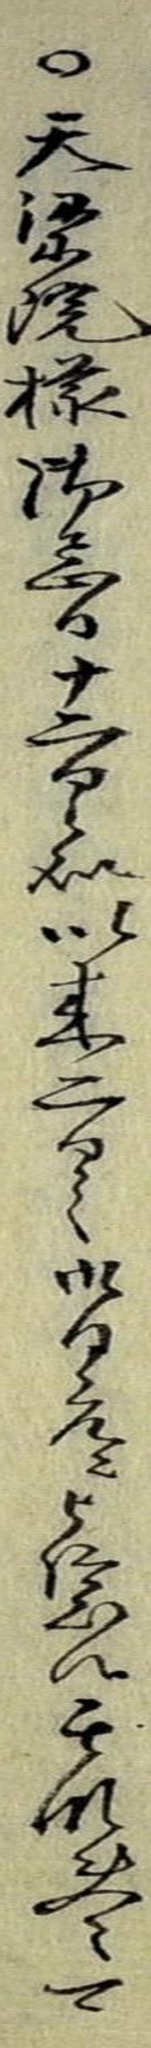○天梁院様御忌日十二日之処御二日之日取ニ被仰出候其段夫々可
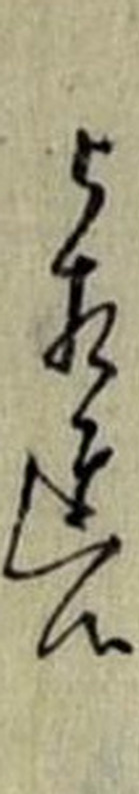被相達候
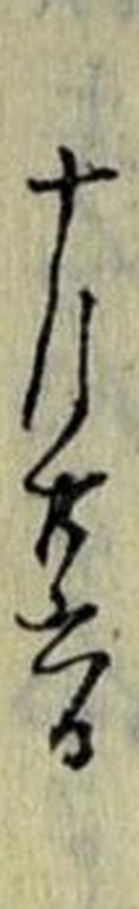十月廿六日
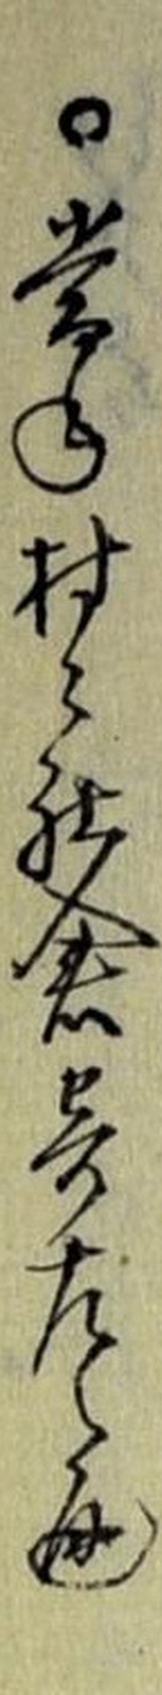○当年村々社倉寄左之通
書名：命令之部 五
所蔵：福井県文書館 Fukui Prefectural Archives
